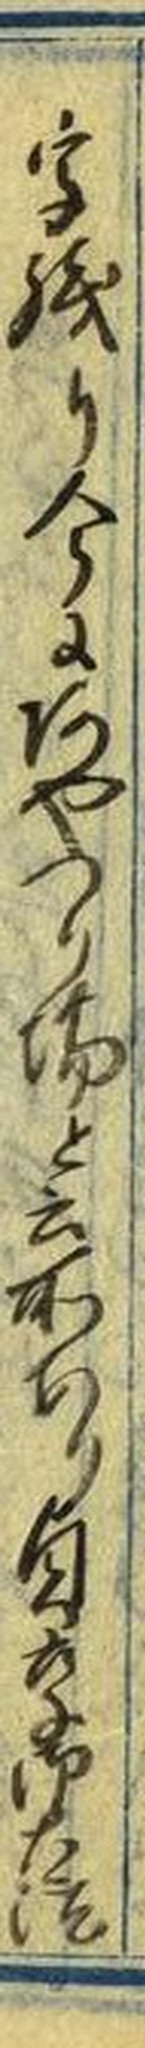字残り今にあやつり場と云所あり貞享御太法
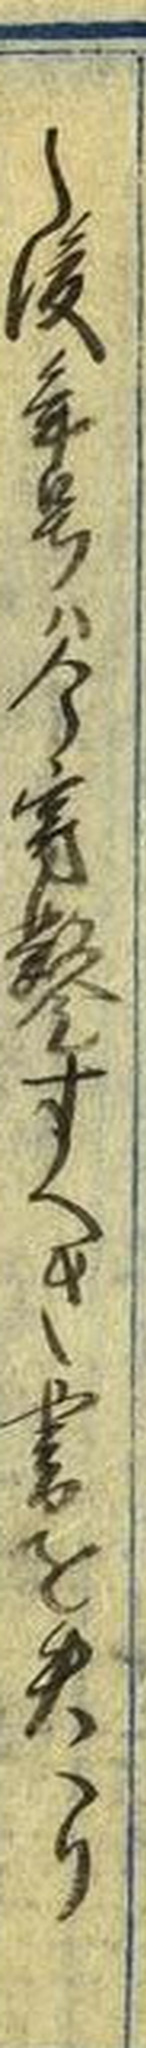之後年号は今寄鑿すへき書を失へり
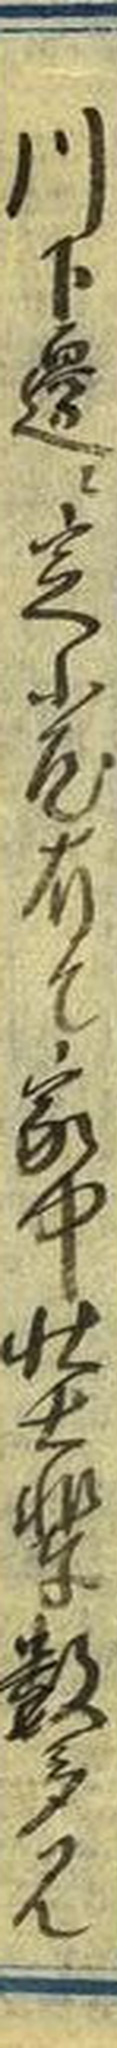川下辺に定小屋有りて家中壮士輩数多見
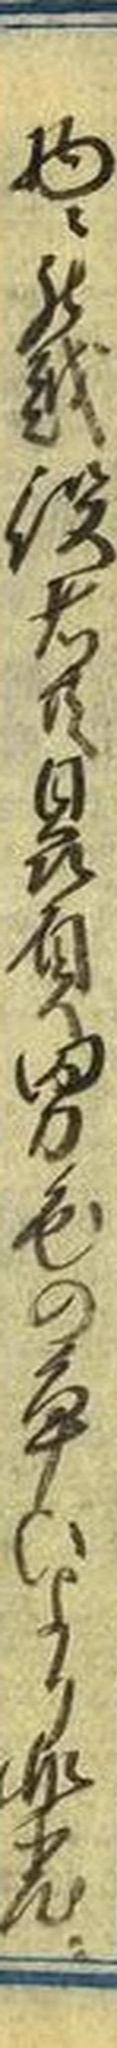物に罷越役者共贔屓男色の争ひにより楽屋に
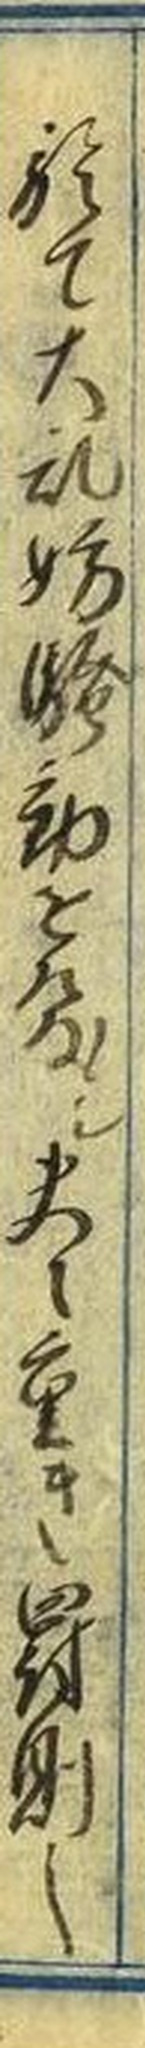於て大乱妨騒動を発し夫々重き罰則之
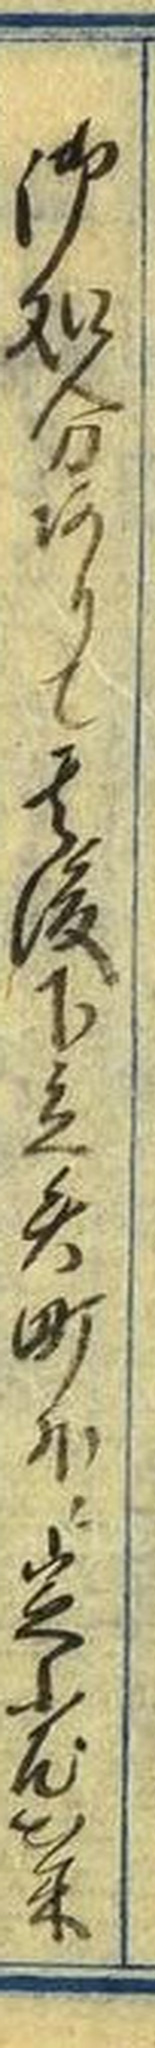御処分ありて其後下立矢町外に定小屋出来
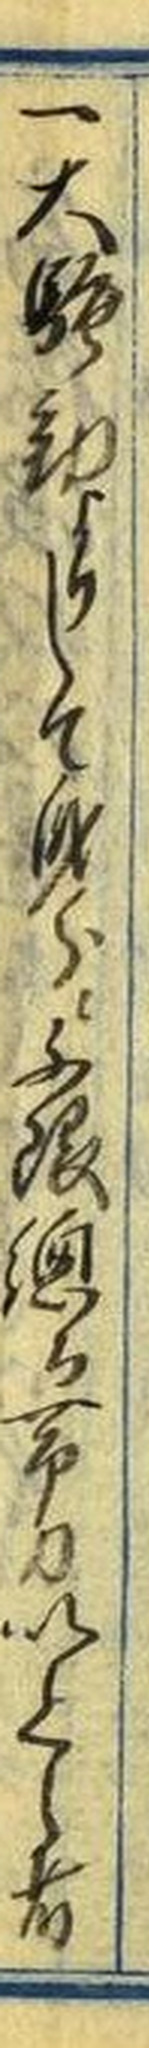一大騒動よりして身分に不限総而帯刀以上之者
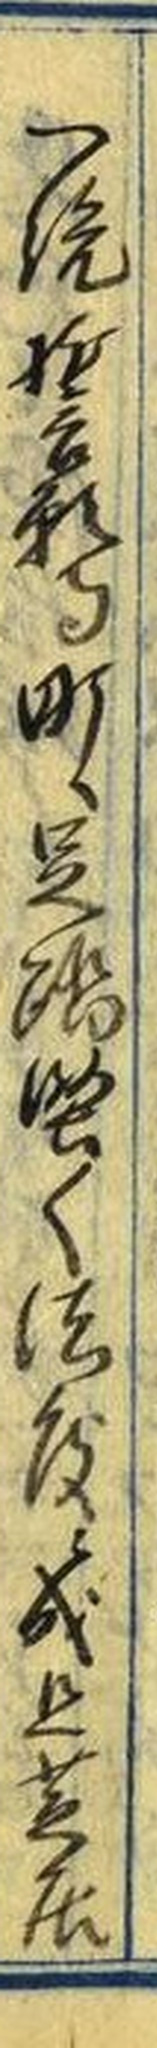一統誓願寺町へ足踏堅く法度に成且芝居

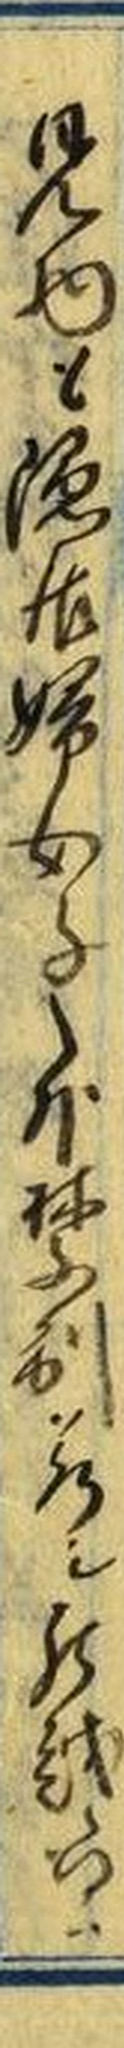見物も隠居婦女子之外禁制若し罷越候得は
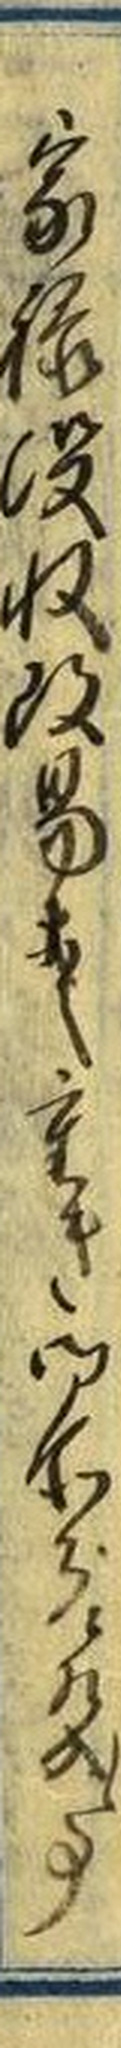家禄没収改易等之重き御所分に相成候事
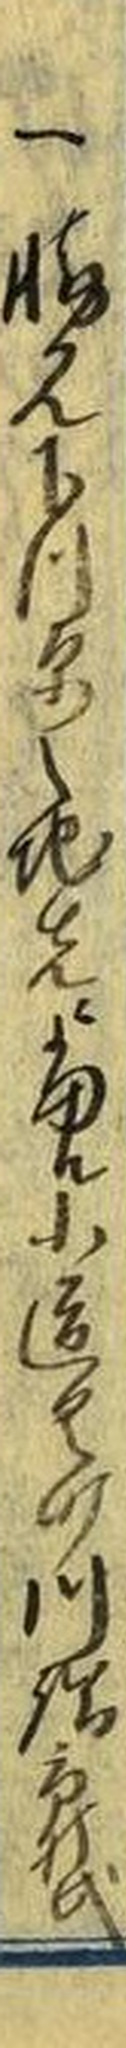一勝見下川原之地先に当る小道具町川端市井氏
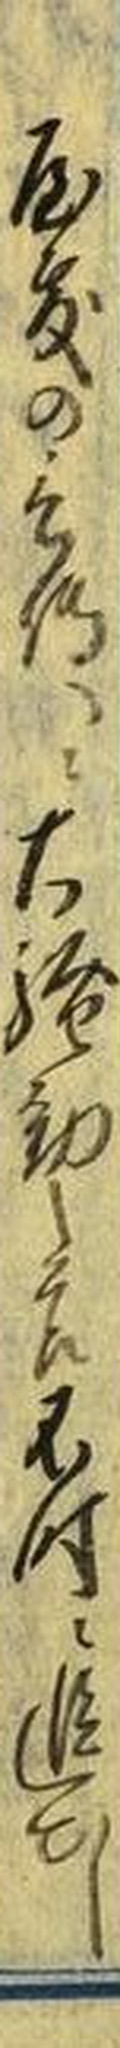屋敷の言伝へに大騒動之節不時に追出し
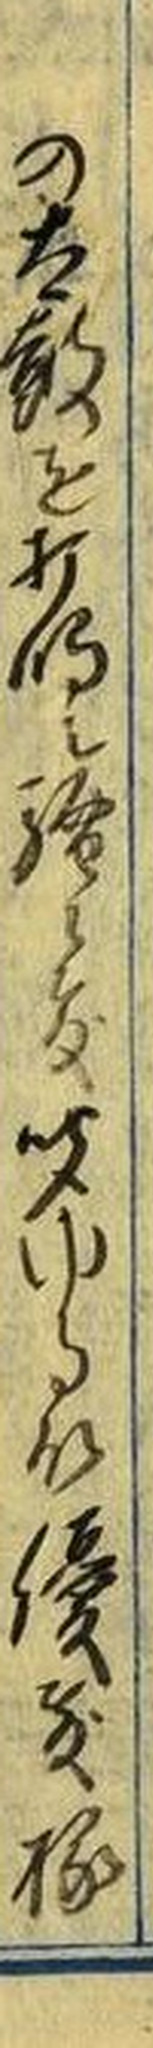の太鼓を打鳴し騒ヶ敷聞ゆる故優敷椽
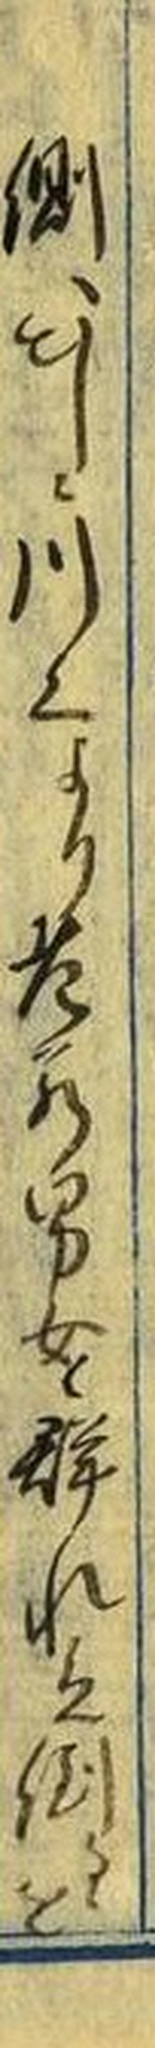側へ出しに川上より老若男女と群れ立倒るゝを
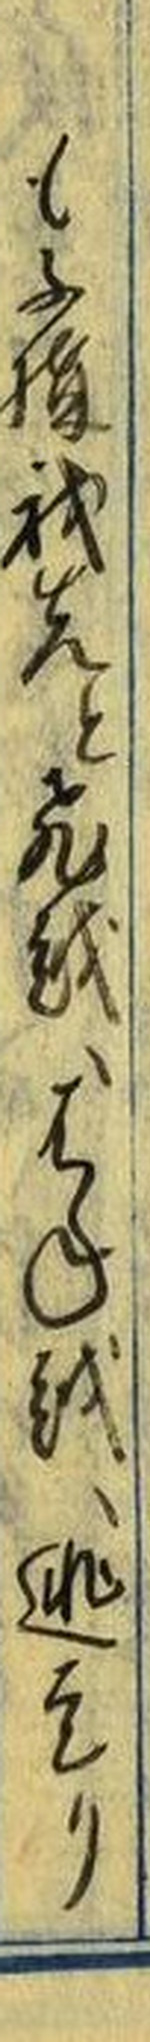も不構我先と飛越へはね越へ逃走り
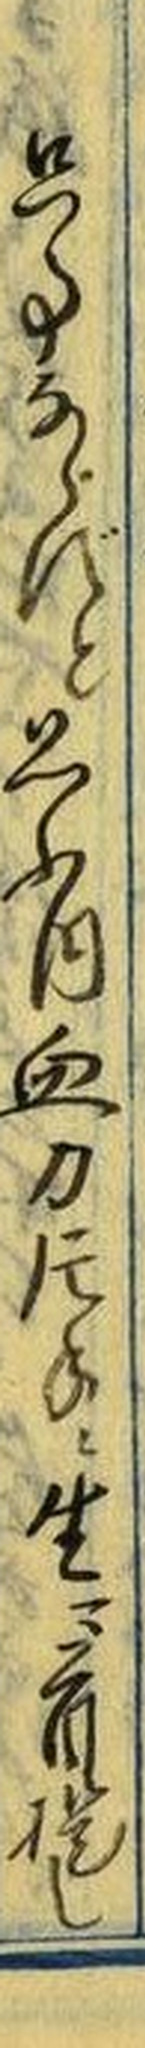只事ならずと思ふ内血刀片手に生ま首提之
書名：温古集 五巻
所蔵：福井県文書館 Fukui Prefectural Archives
